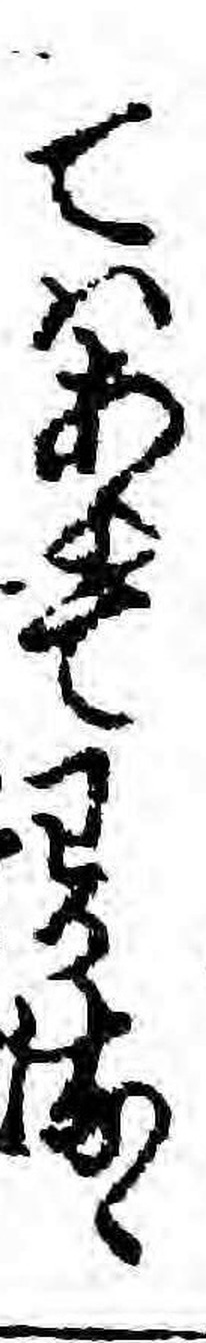てはあふてわかるゝ
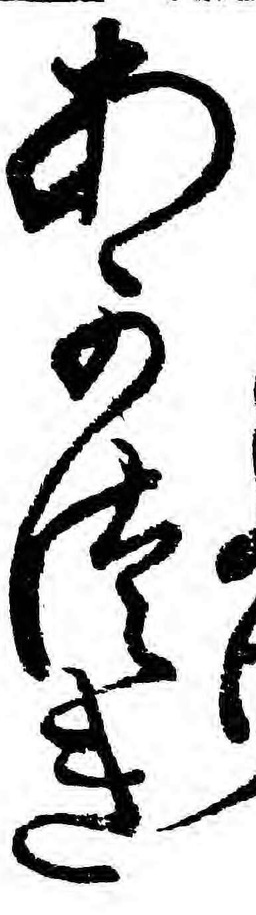あかつき
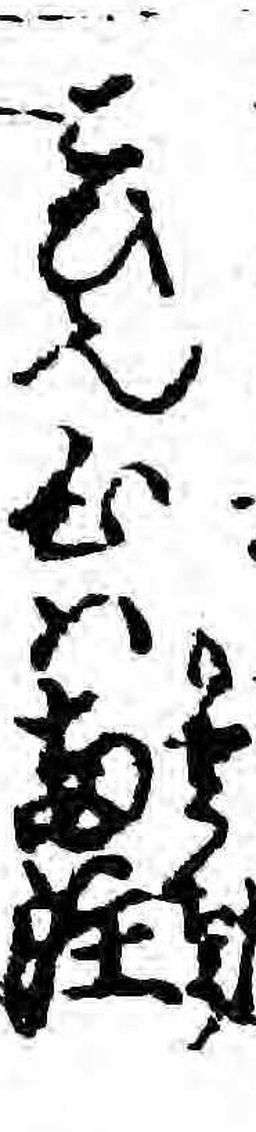こひ也心は両注
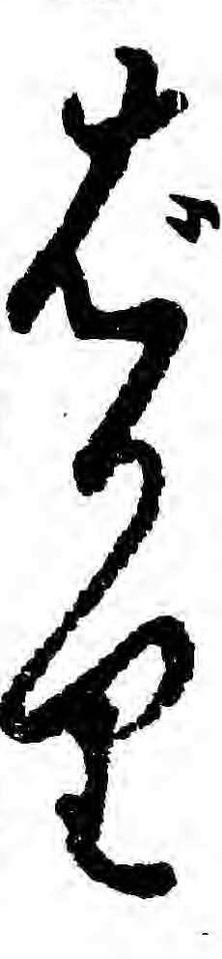ばかり
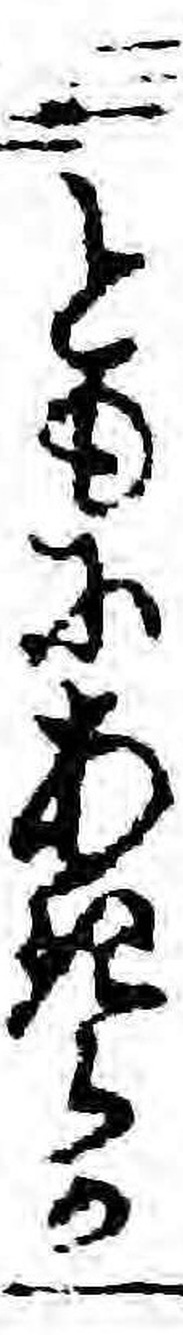ともにあきらか
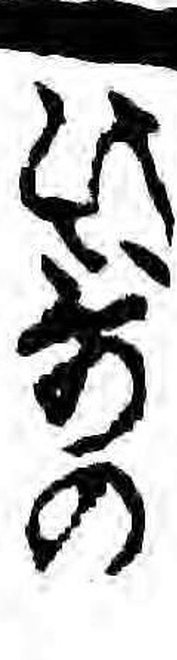此哥の
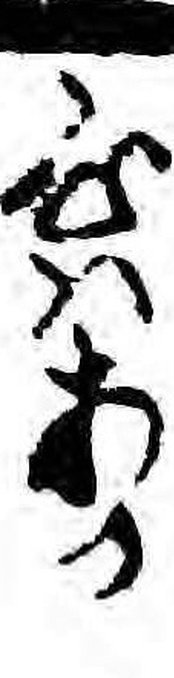心はあか
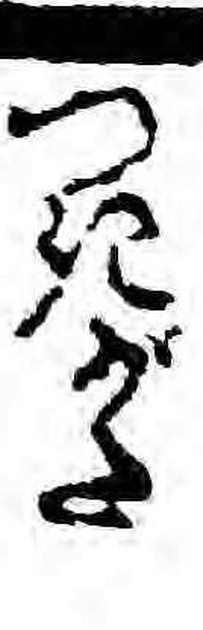つきがた
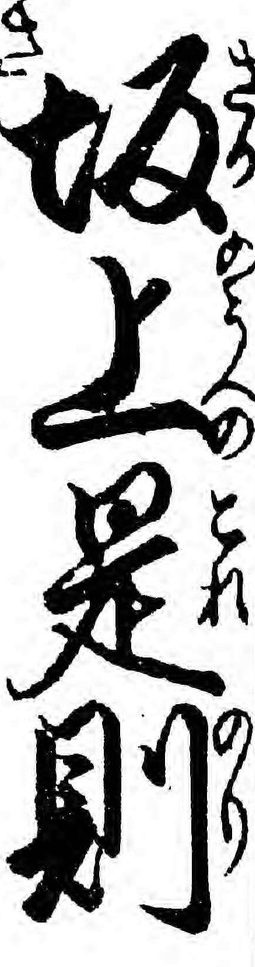坂上是則
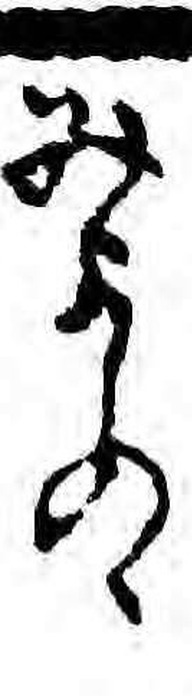みよしのゝ
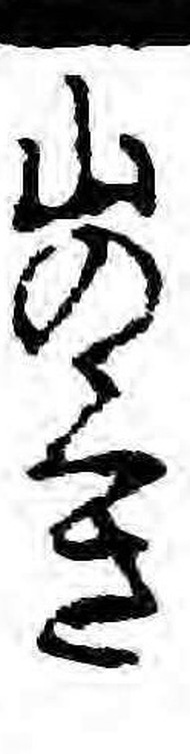山のくさ
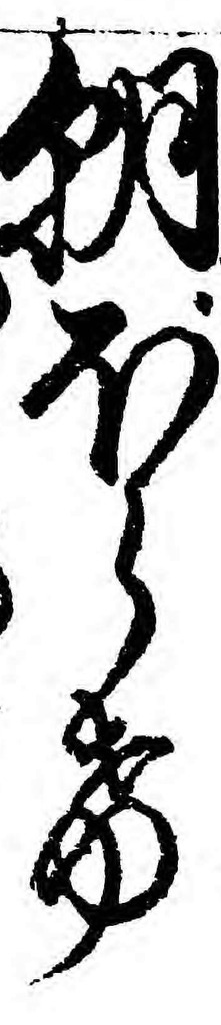朝ぼらけ
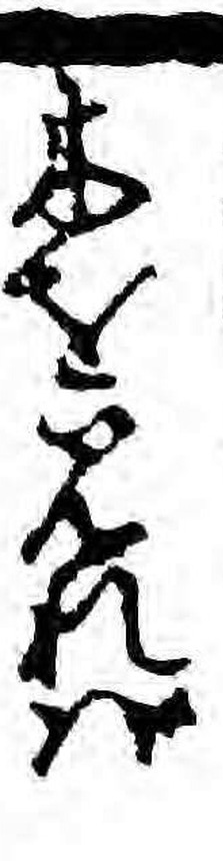木を見れば
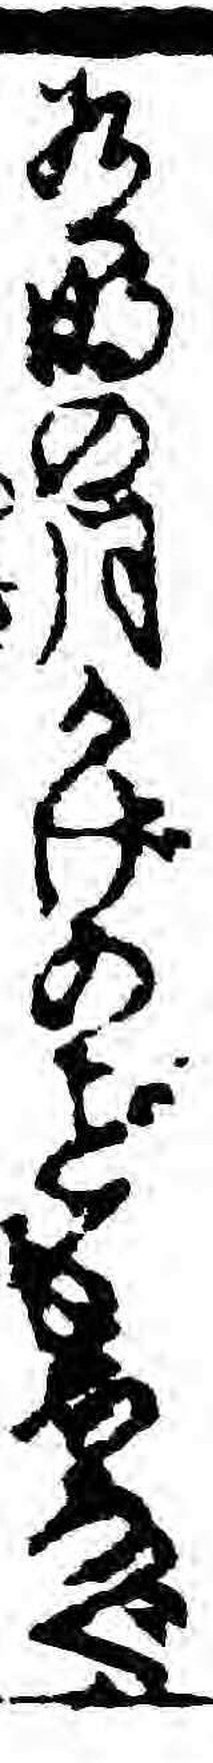有明の月かげのごとくしろ〴〵
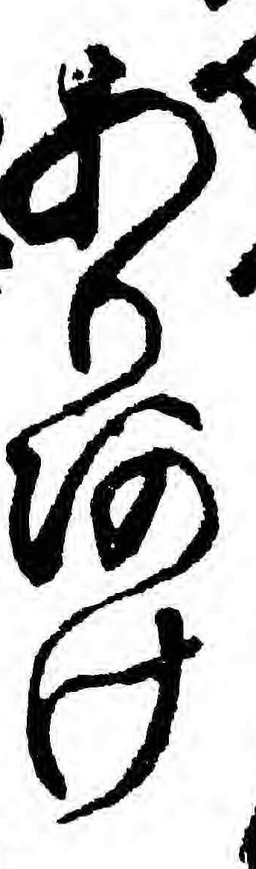ありあけ
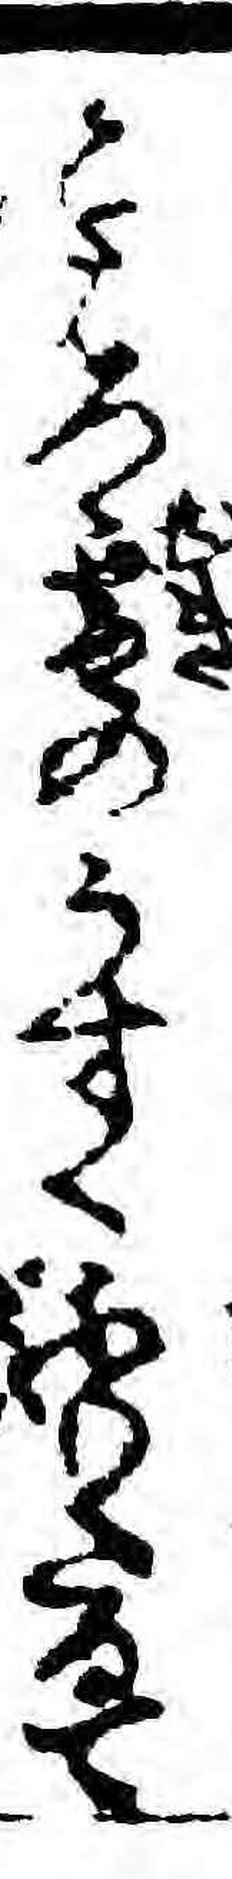とはつ雪のうすくふりたるて
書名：頭書和歌注譯／壽賀多百人一首小倉錦
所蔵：国文学研究資料館
